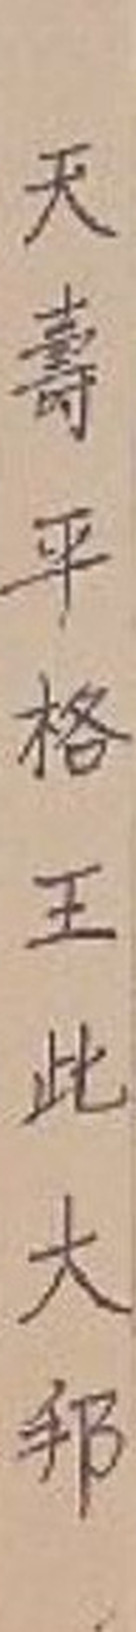吉天寿平格王此大邦
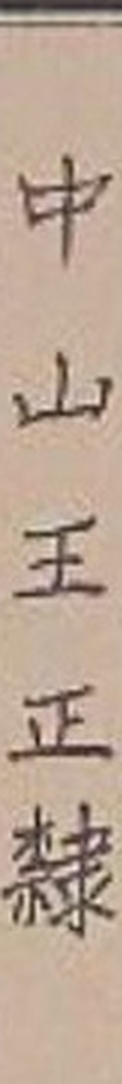中山賢王正
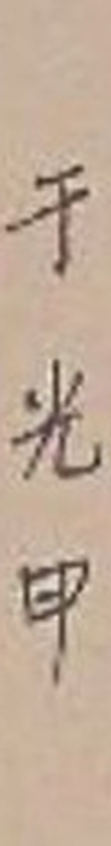干光甲
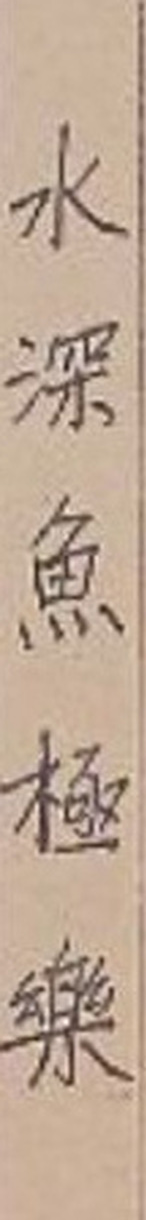水深魚極楽
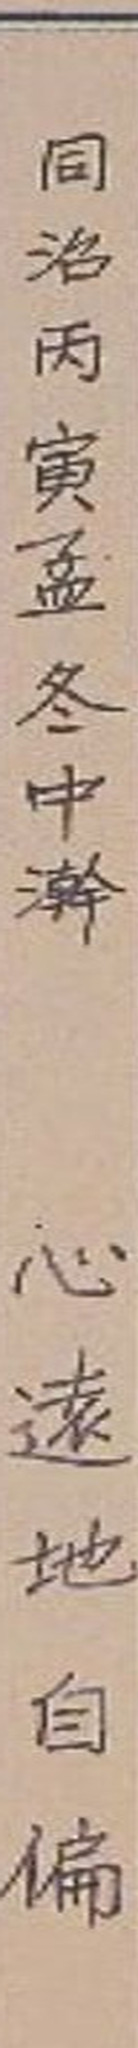同治丙寅孟冬中澣心遠地自偏
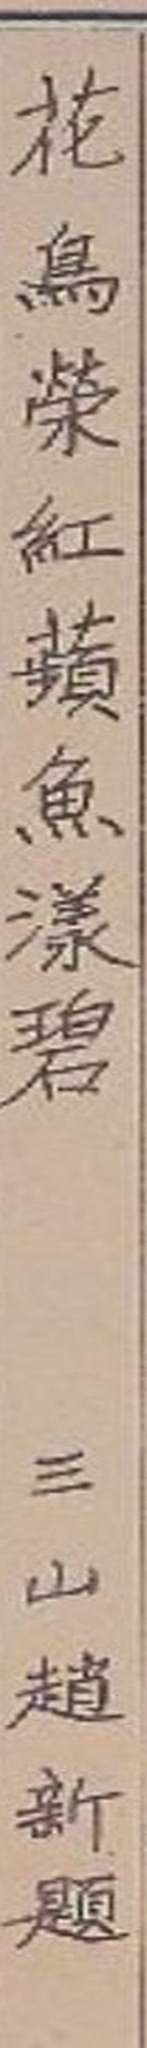花鳥栄紅蘋魚漾碧三山趙新題
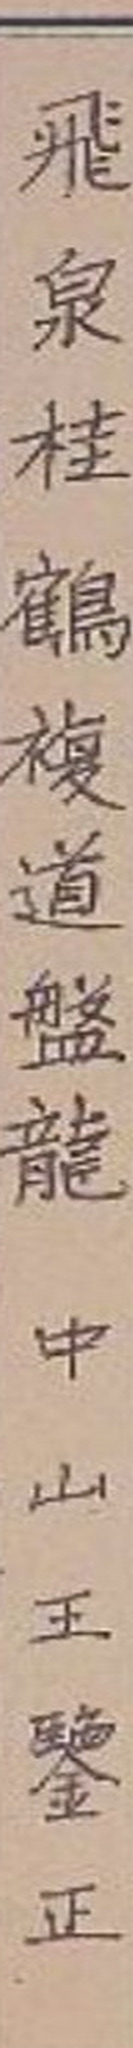飛泉桂鶴複道盤龍中山王監正
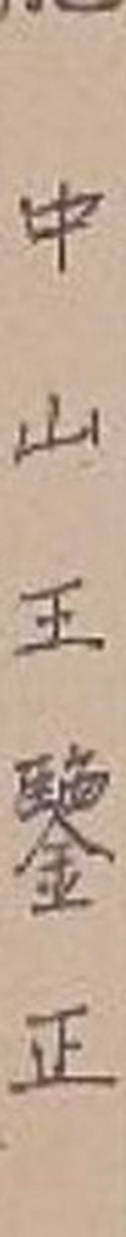中山賢王正

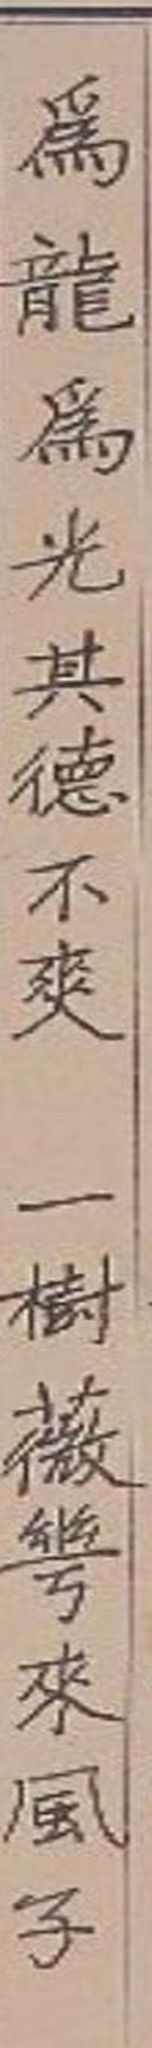為龍為光其徳不爽一樹薇甹来風子
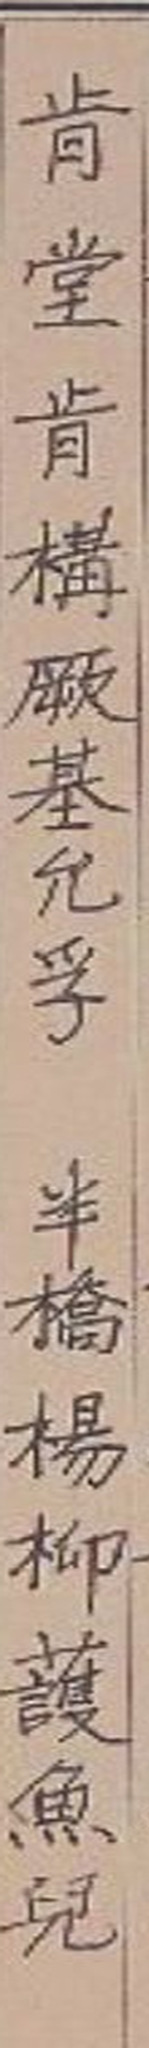肯堂肯構闕基允孚半橋楊柳護魚児
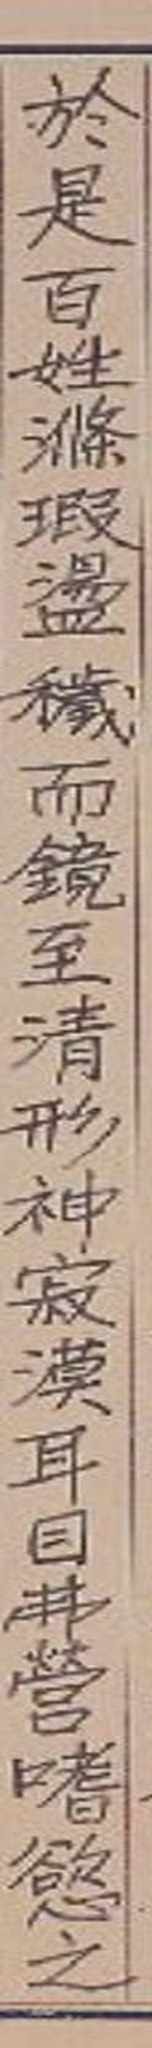於是百姓滌瑕盪穢而鏡至清形神寂漠耳目弗営嗜慾之
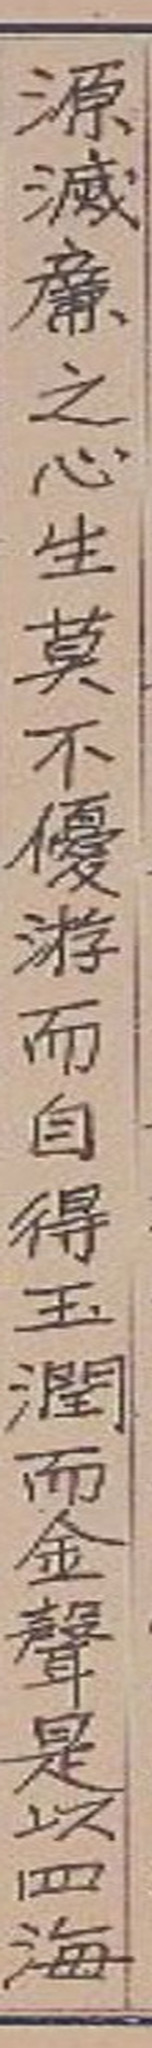源滅亷之心生莫不優游而自得玉潤而金声是以四海
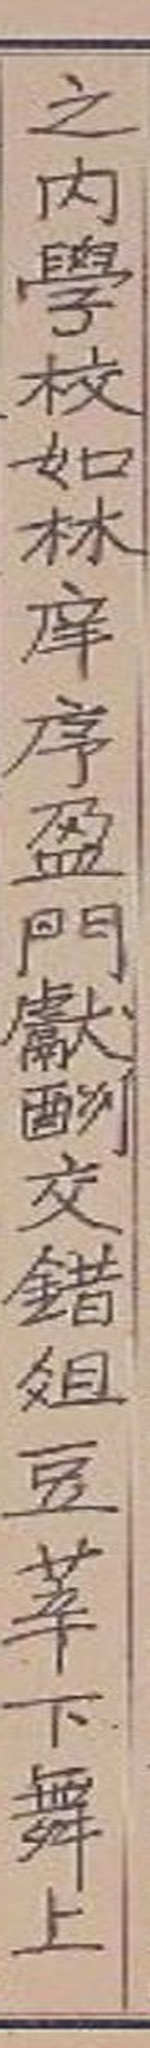之内学校如林庠序盈門献酬交錯俎豆莘下舞上
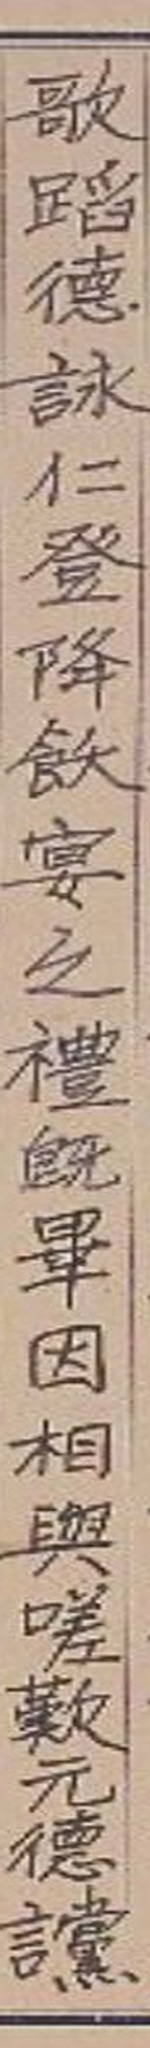歌蹈徳詠仁登降飫宴之礼既畢因相与蹉歎元徳讜
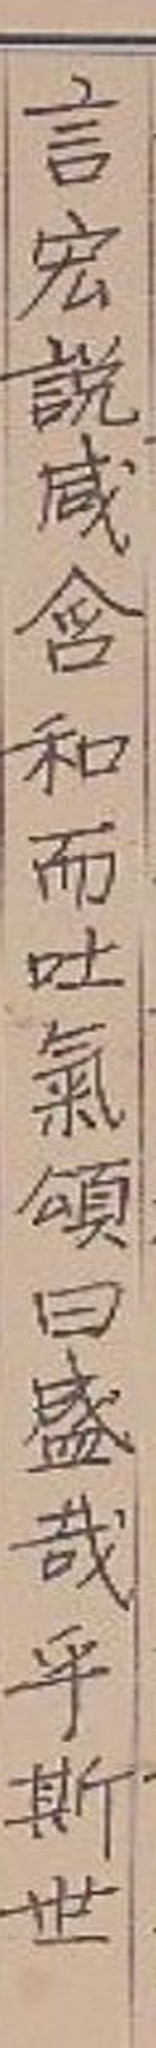言宏説咸含和而吐気頌曰盛哉乎斯世
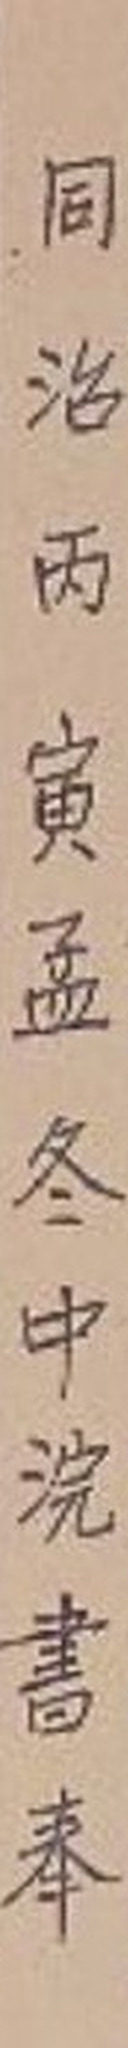同治丙寅孟冬中浣書奉
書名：支那冊封使来琉諸記 下巻
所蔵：University of the Ryukyus Library
